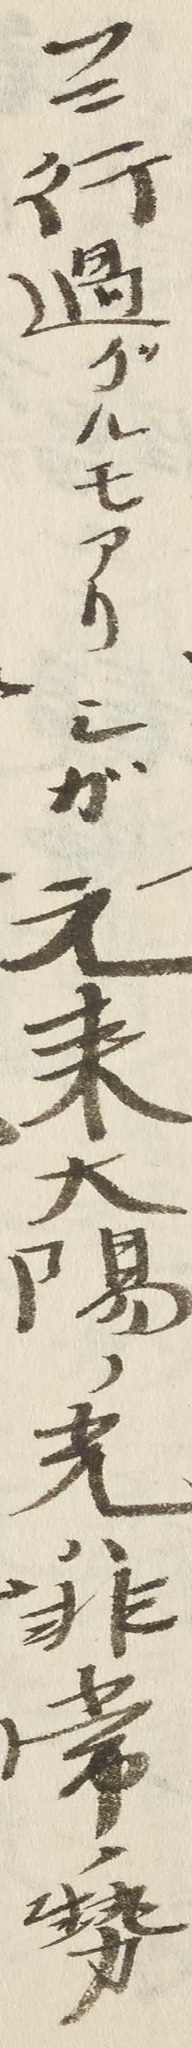フニ行過グルモノアリシガ元来大陽ノ光ハ非常ノ勢
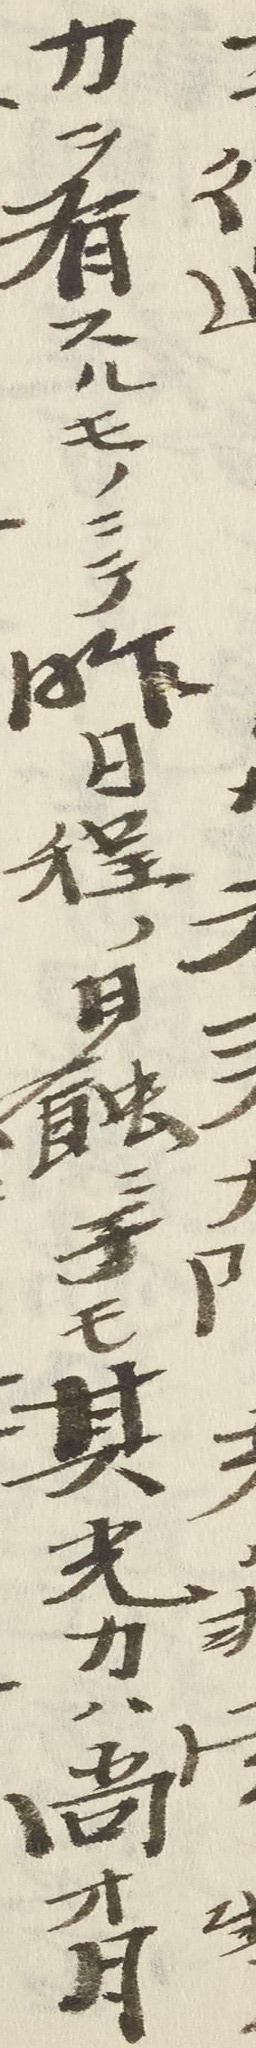力ヲ有スルモノニテ昨日程ノ日蝕ニテモ其光力ハ尚ォ月
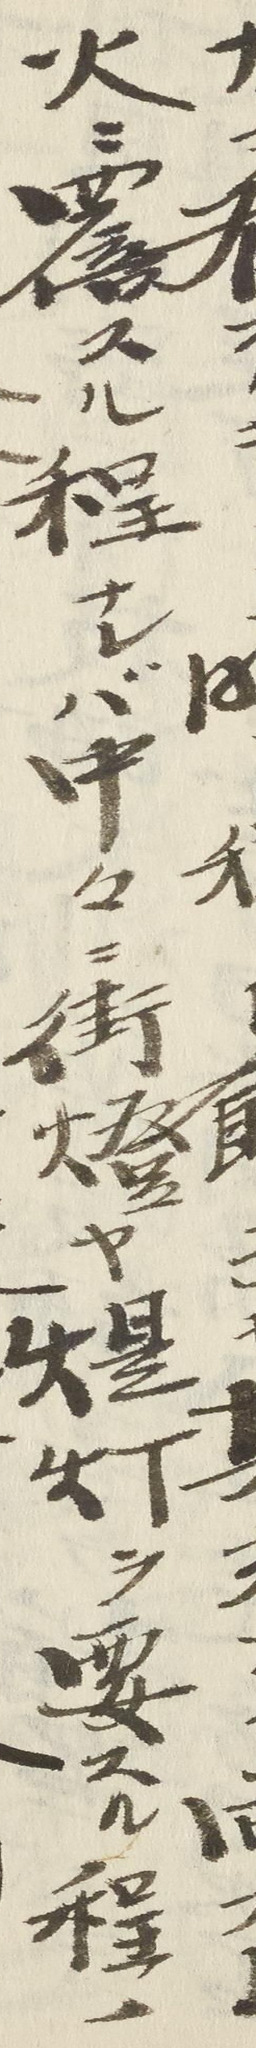火ニ四倍スル程ナレバ中々二街燈ヤ提灯ヲ要スル程ノ
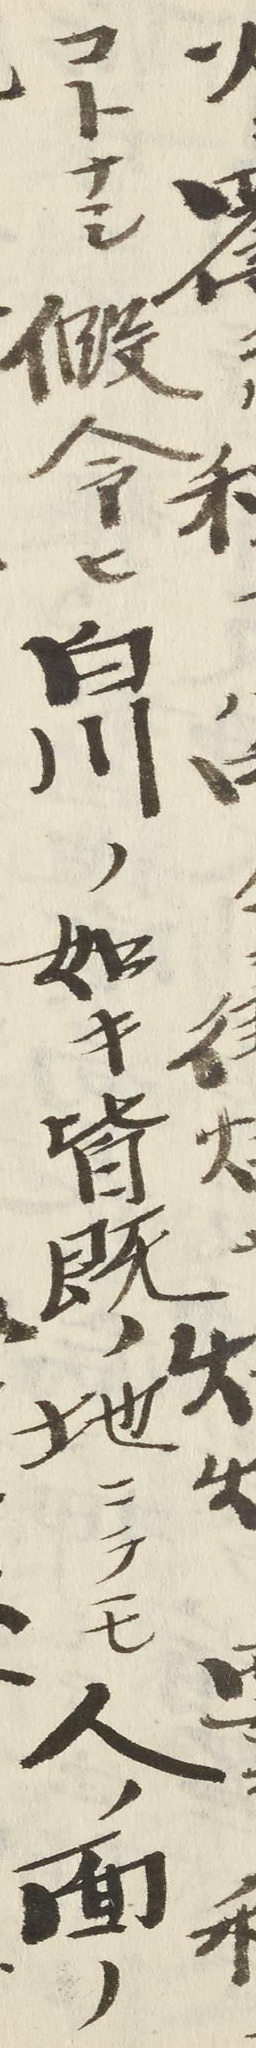コトナシ仮令ヒ白川ノ如キ皆既ノ地ニテモ人ノ面ノ
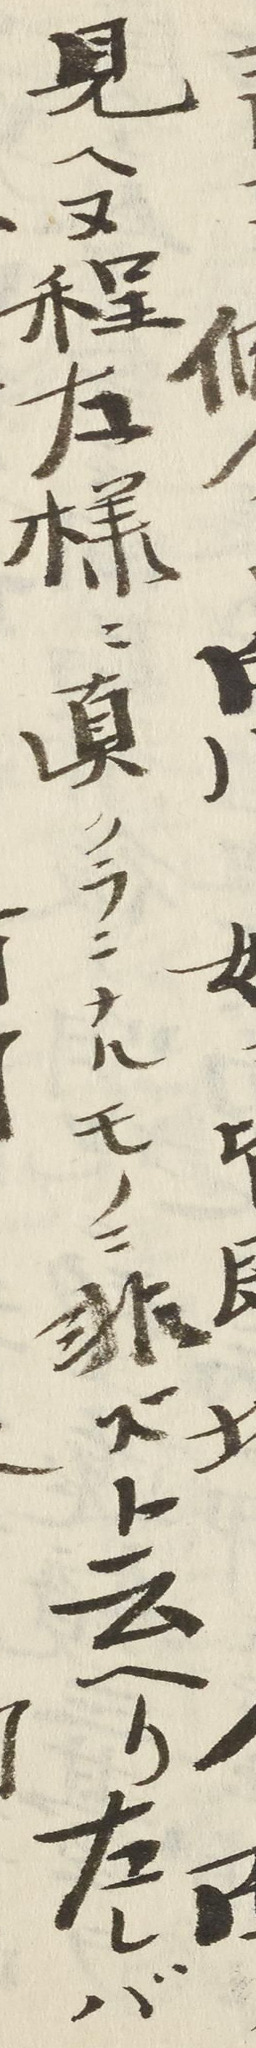見ヘヌ程左様二真クラ二ナルモノ二非ズト云ヘリ左レバ
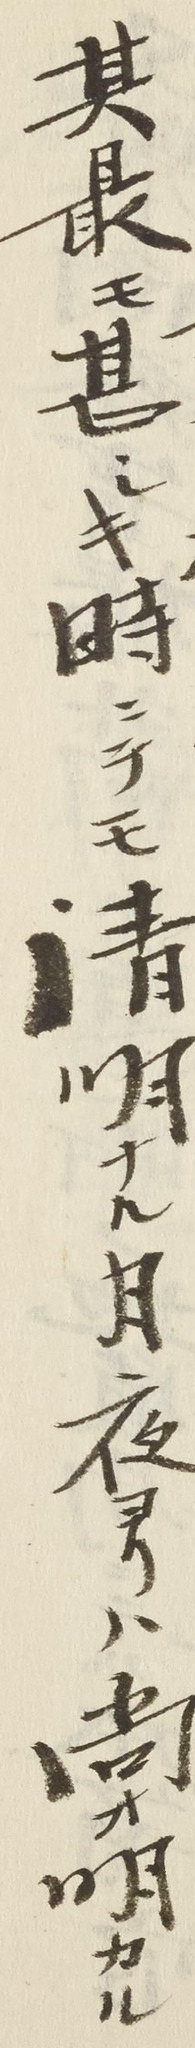其最モ甚シキ時ニテモ清明ナル月夜ヨリハ尚ォ明カル
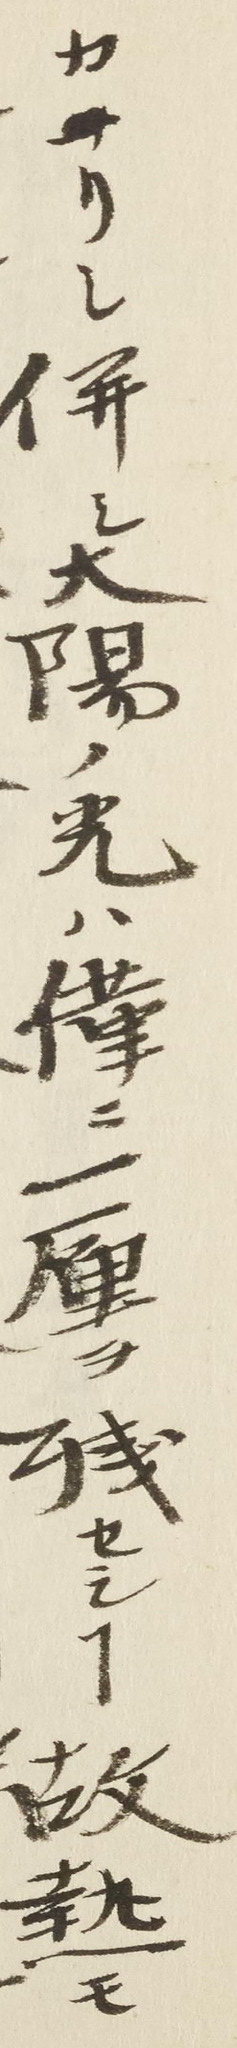カリシ併シ大陽ノ光ハ僅二一厘ヲ残セシコト故熱モ
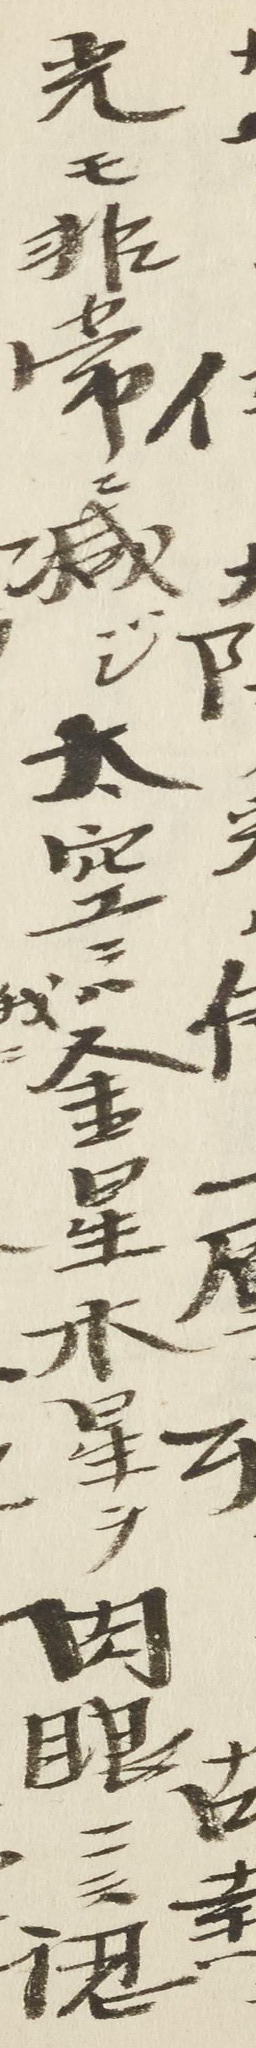光モ非常ニ減ジ太空ニハ金星木星ヲ肉眼ニテメ認
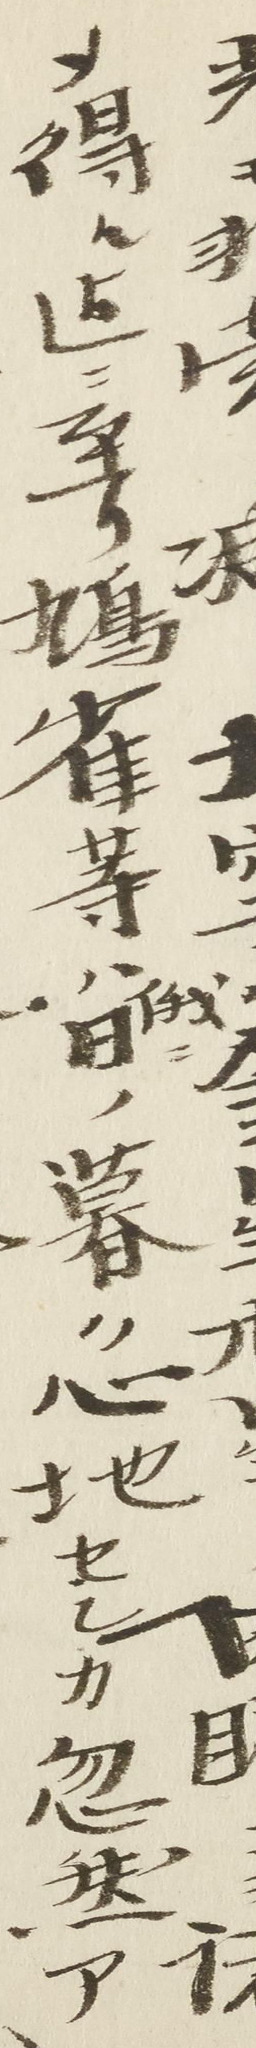メ得ル迄二至リ鳩雀等ハ暮ノ心地セシカ忽然ア
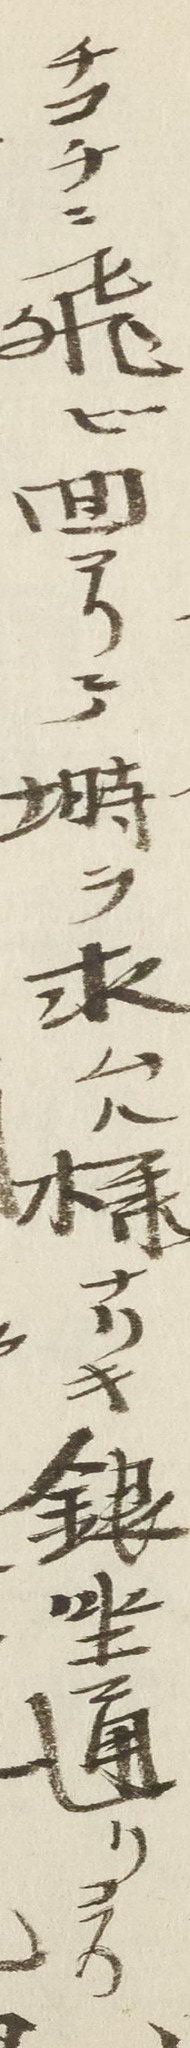チコチ二飛ビ回マリテ塒ラ求ムル様ナリキ銀座通リヨリ
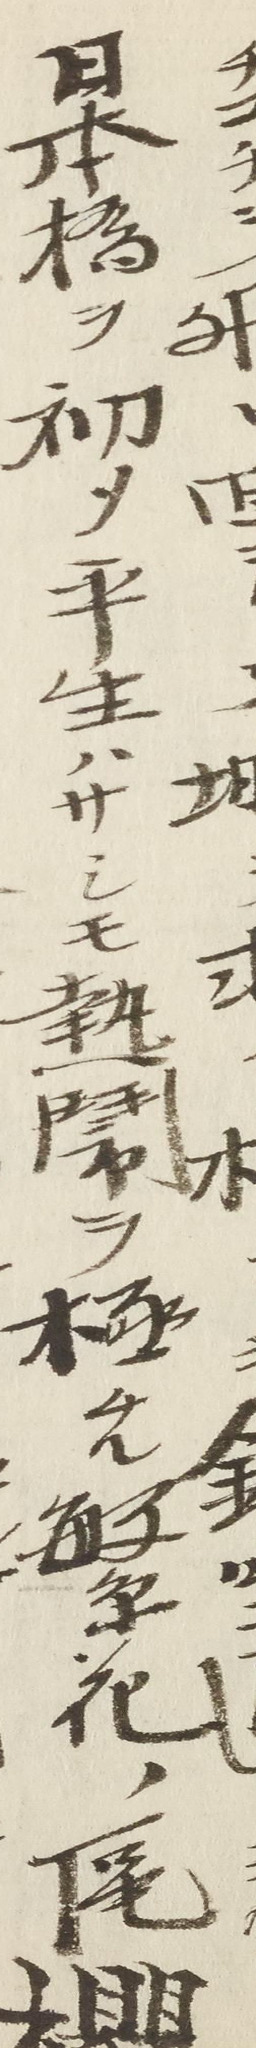日本橋ヲ初メ平生ハサシモ熱閙ヲ極ムル繁花ノ
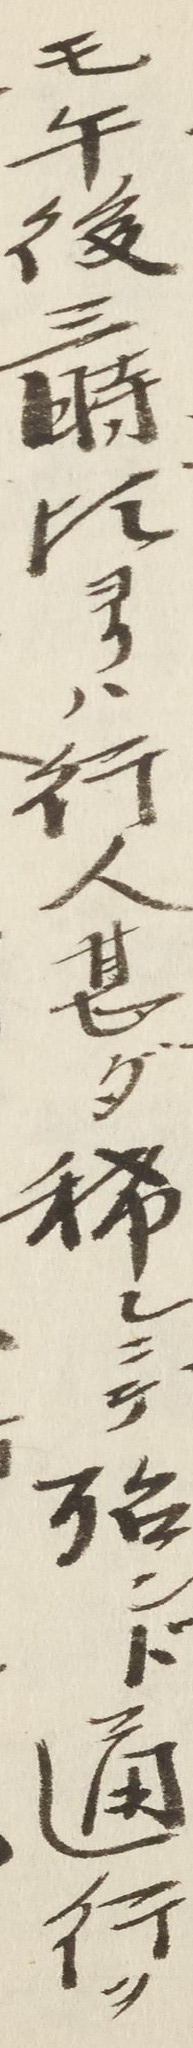モ午後三時頃ヨリハ行人甚ダ稀レニテ殆ンド通行ヲ
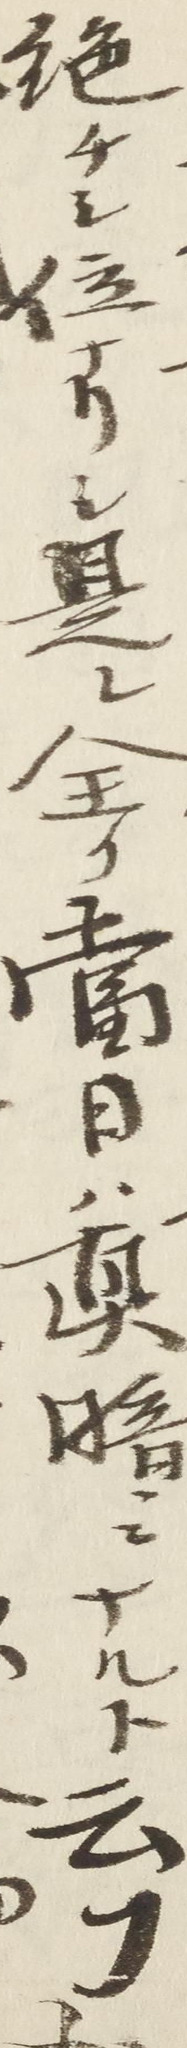絶チシ位ナリシ是レ全ク当日ハ真暗二ナルト云フ
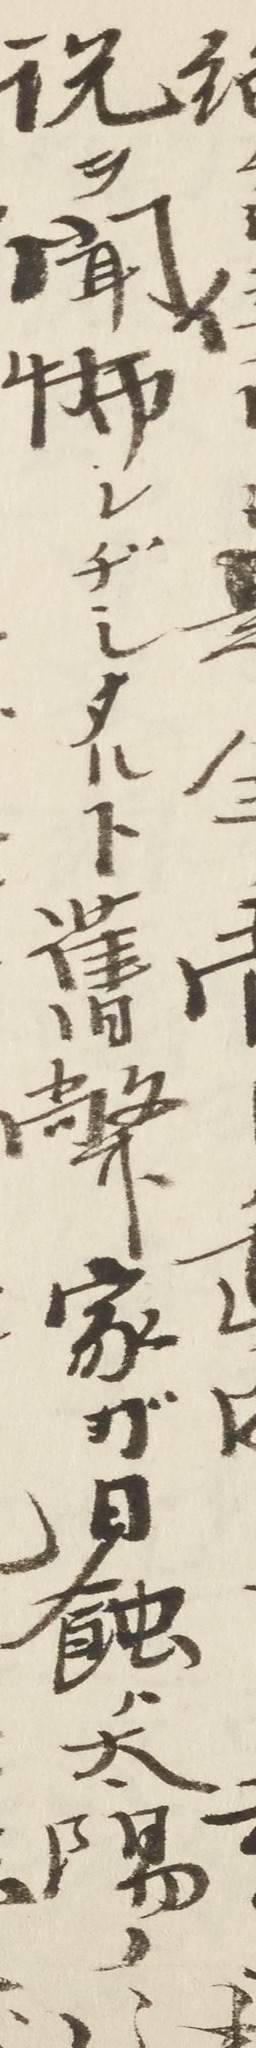説ヲ聞怖レヂシタルト旧弊家ガ日蝕ハ太陽ノ
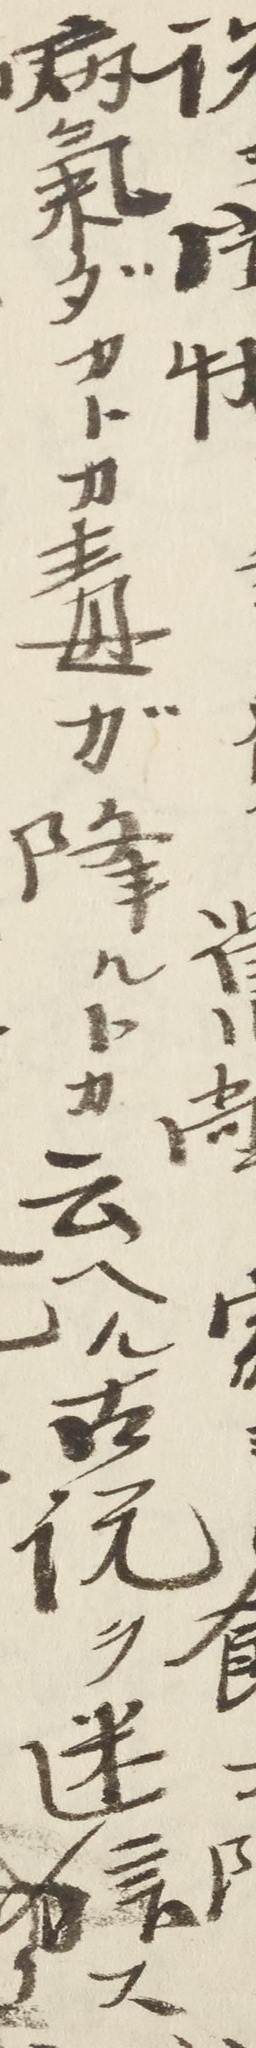病気ダカトカ毒ガ降ルトカ云ヘル古説ヲ迷信ス
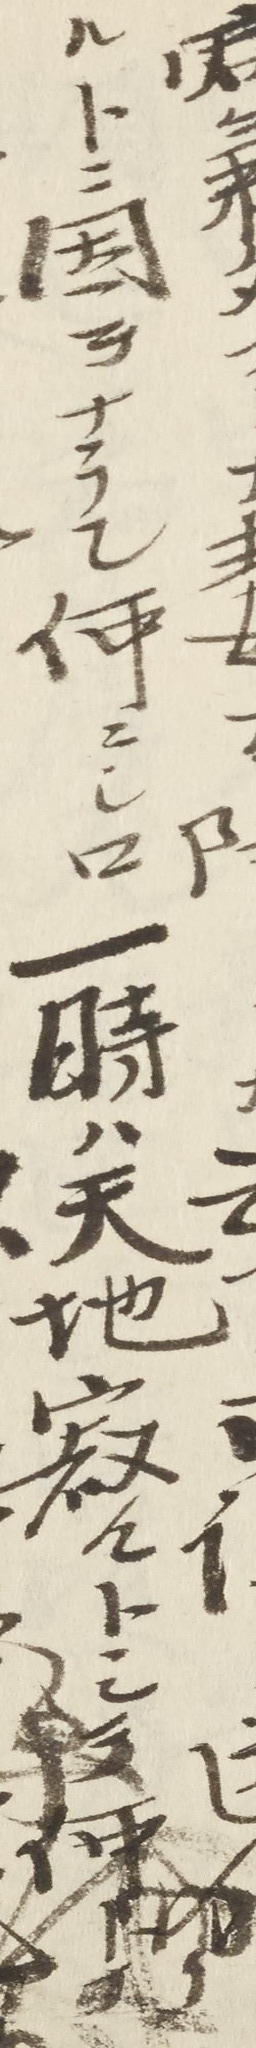ルコト二因テナラン何二シロ一時ハ天地寂々トシテ何トナ
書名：日蝕録　全
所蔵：東京大学地震研究所図書室 Earthquake Research Institute Library, The University of Tokyo, JAPAN
